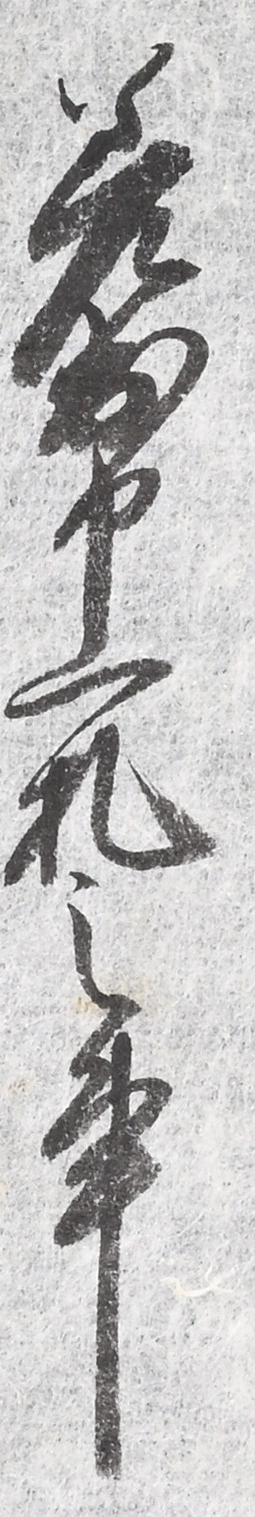差出申一札之事
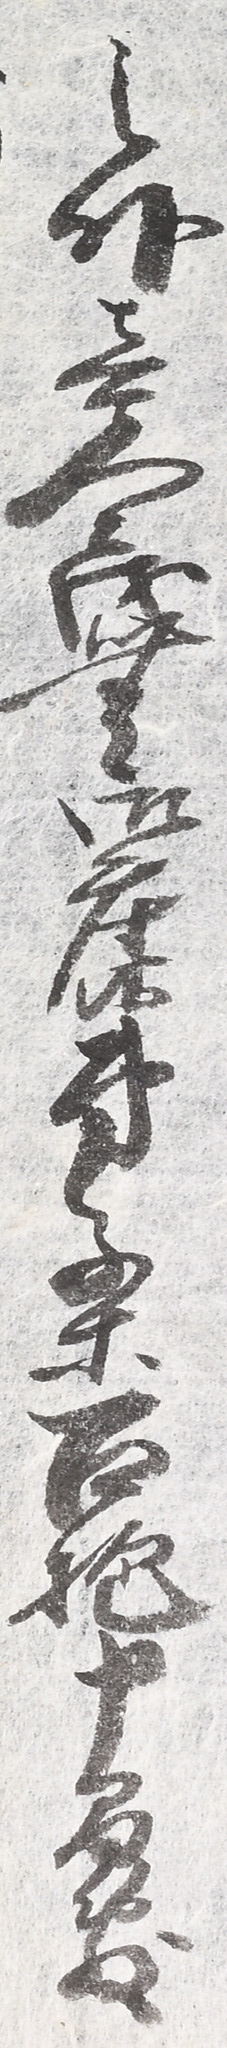之外壱人も無御座候弟子等召抱申間敷
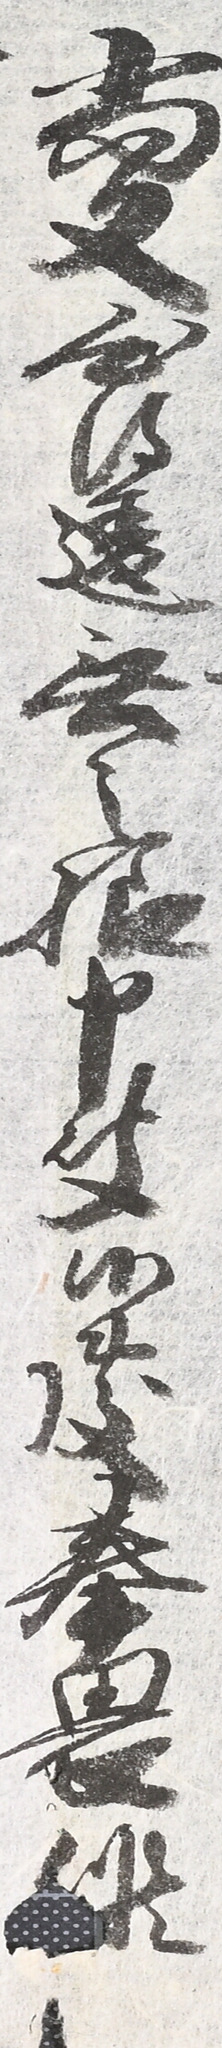尚又心得違無之様申聞候処奉畏候
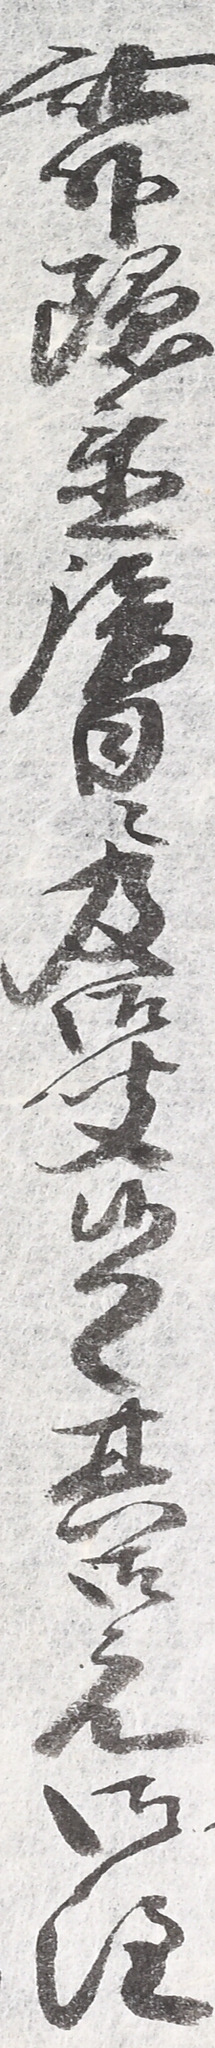此外隠置後日ニ及御聞候ハヽ其御元御注
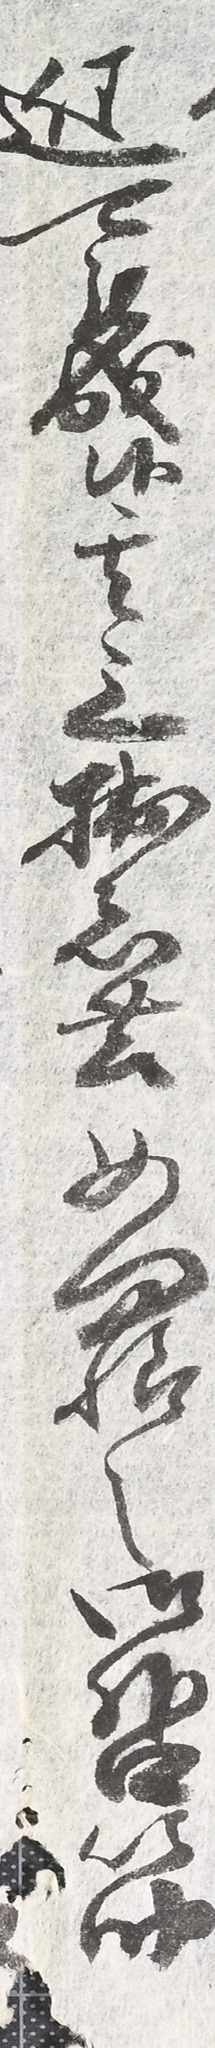進可被成候其上拙者共如何様之御咎筋
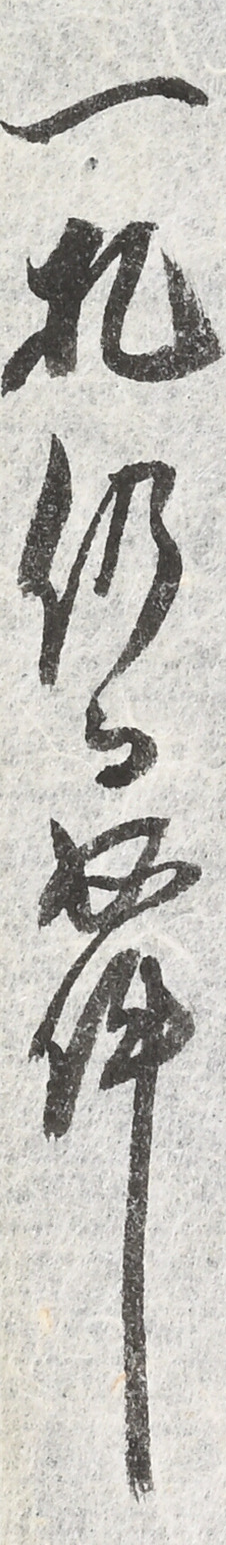一札仍而如件
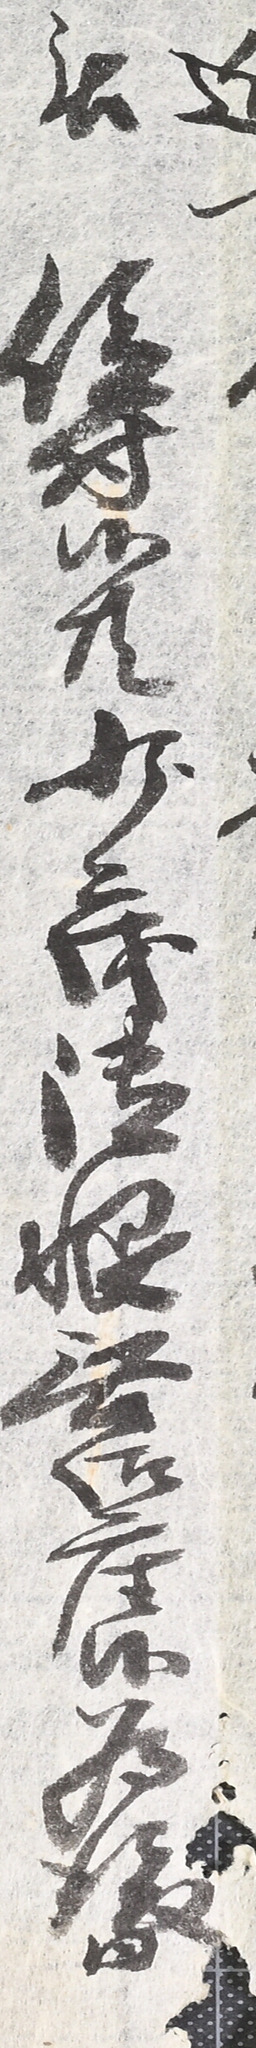被仰付候共少も御恨無御座候為後日
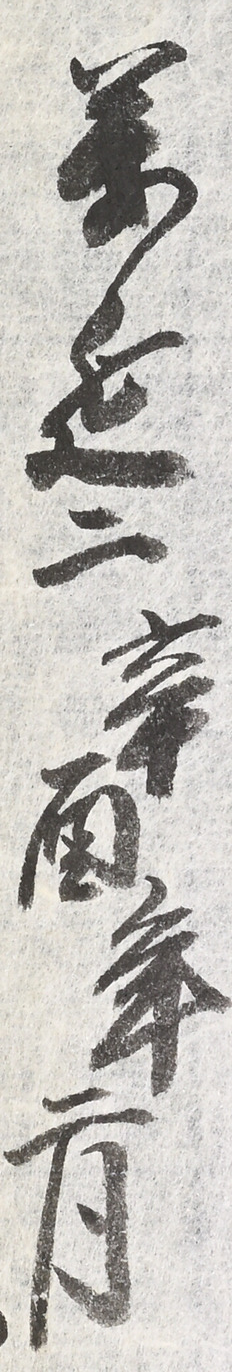万延二辛酉年二月
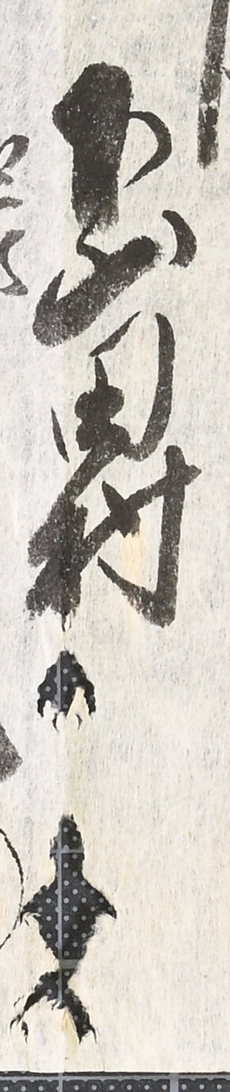下山田村
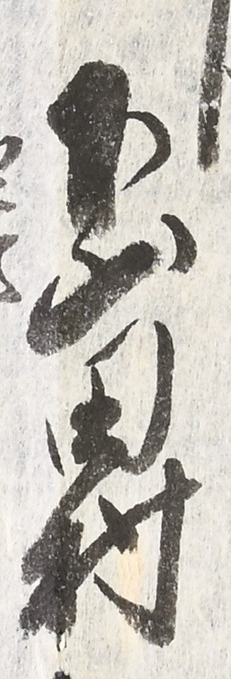下山田村
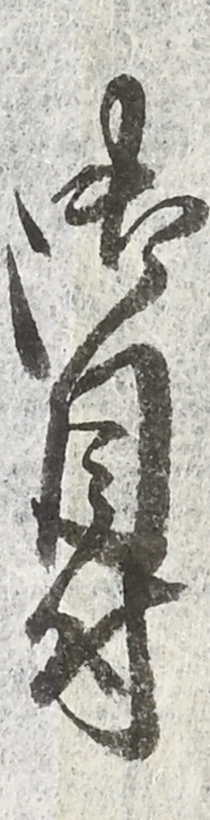御目付
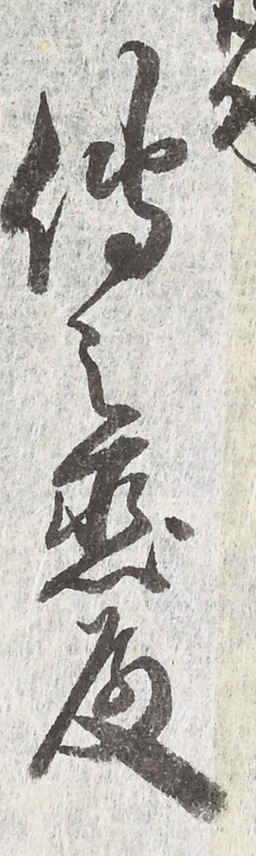伝之丞殿
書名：差出申一札之事
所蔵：伊那市立高遠町図書館・合同会社AMANE
